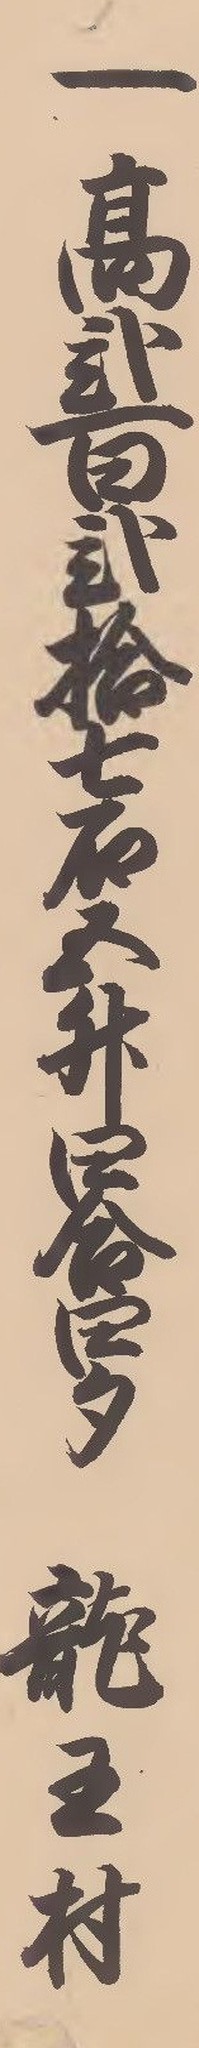一髙弐百弐拾七石五升四合四夕龍王村
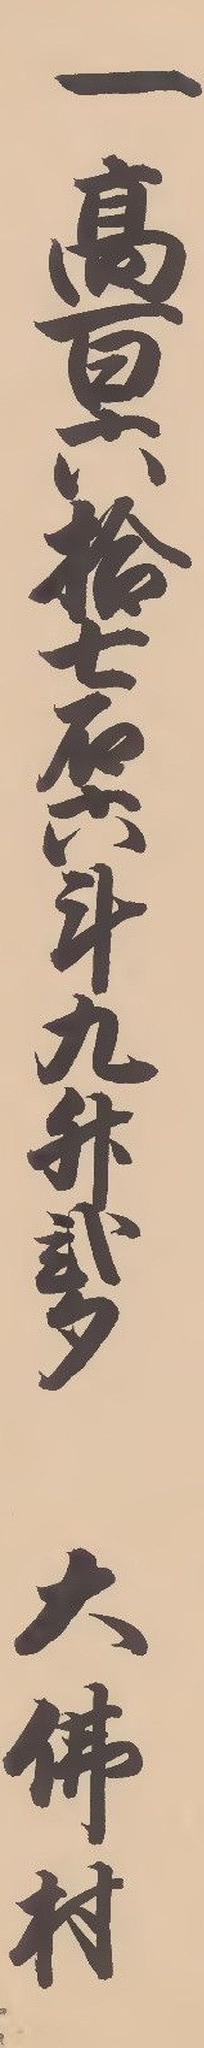一髙百六拾七石六斗九升弐夕大佛村
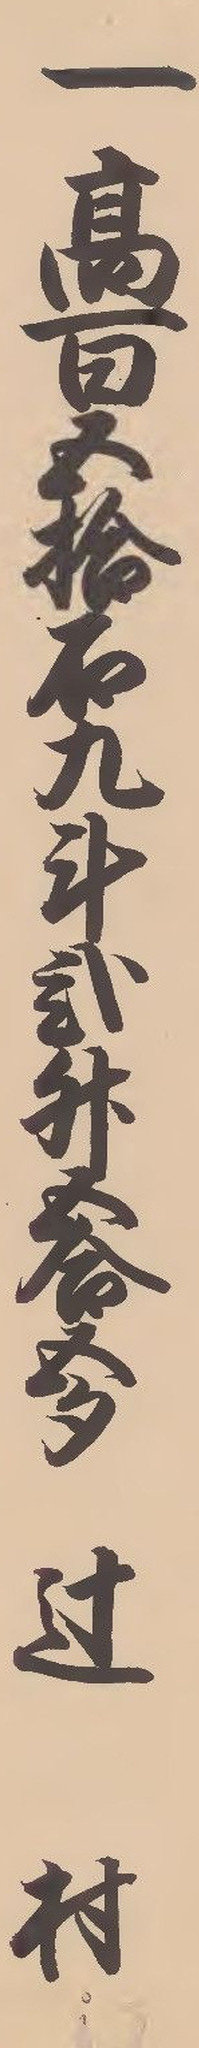一髙百五拾石九斗弐升五合五夕辻村
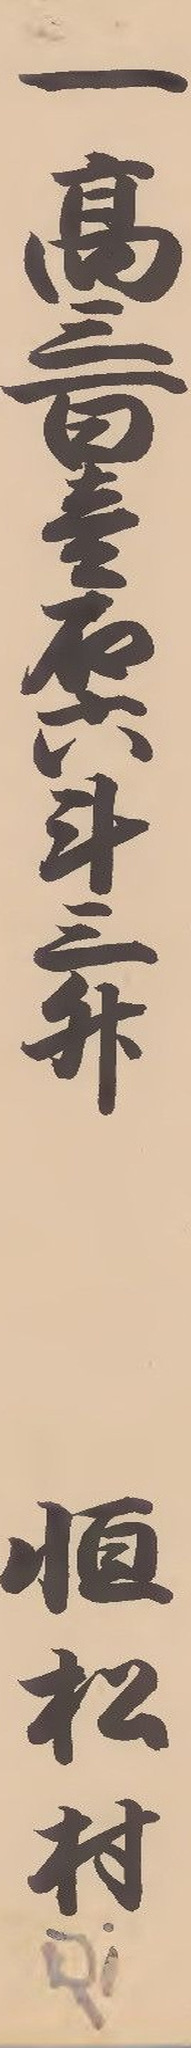一髙三百壱石六斗三升恒松村
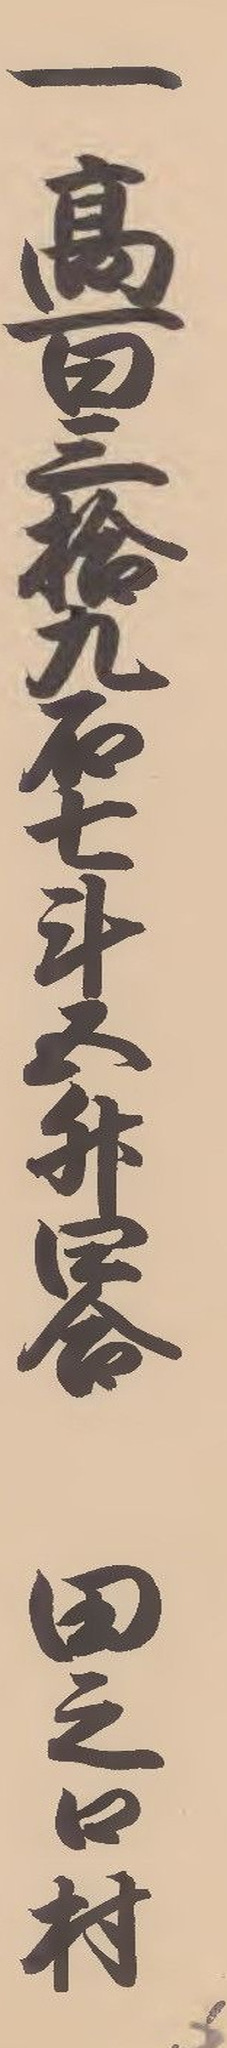一髙百三拾九石七斗五升四合田之口村
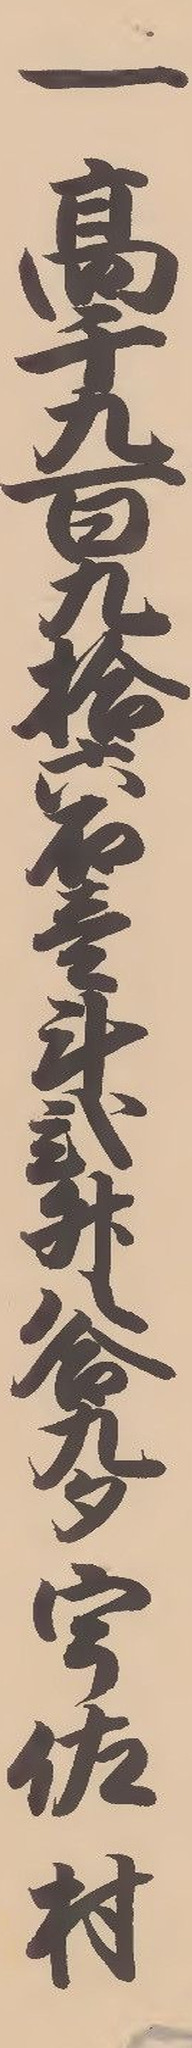一髙千九百九拾六石壱斗弐升八合九夕宇佐村
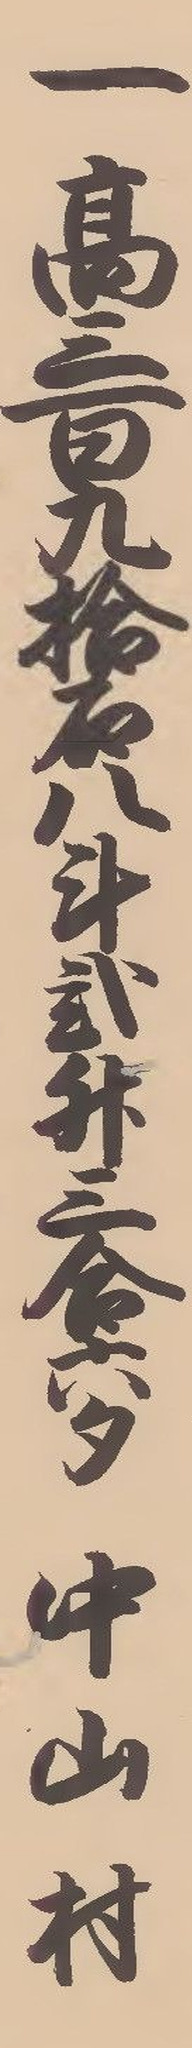一髙三百九拾石八斗壱升三合六夕中山村

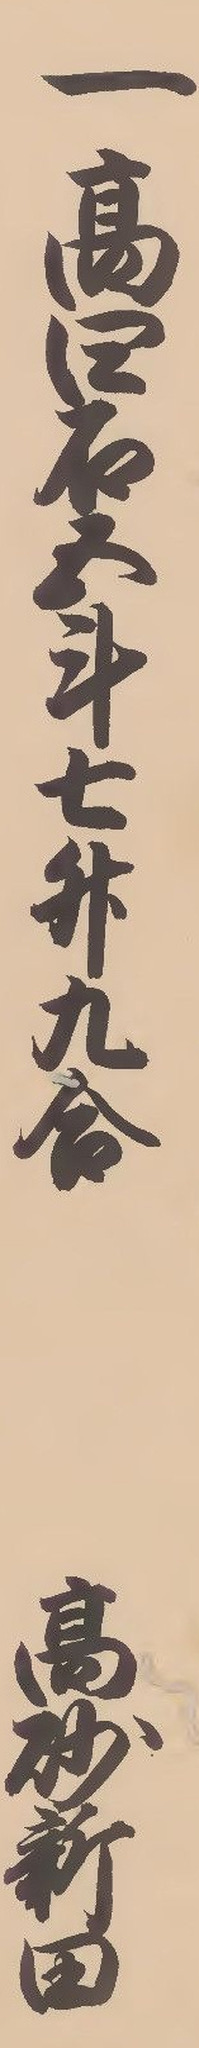一髙四石五斗七升九合高砂新田
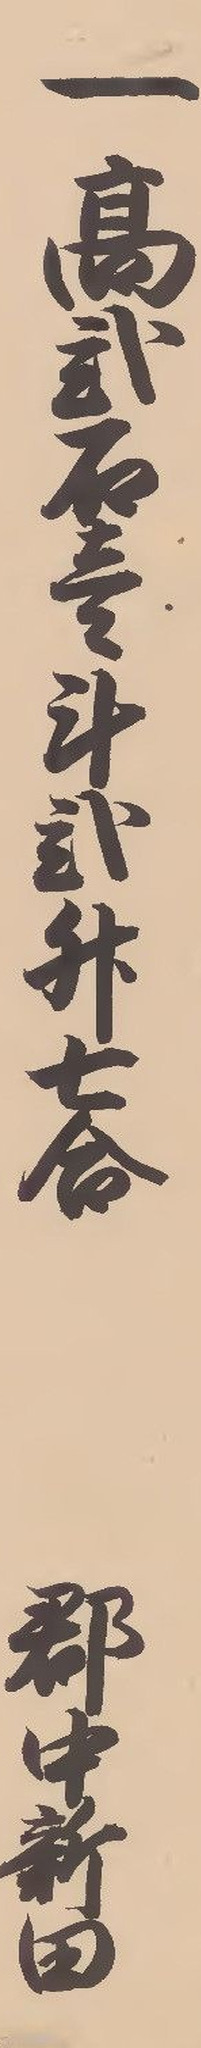一髙弐石壱斗弐升七合郡中新田
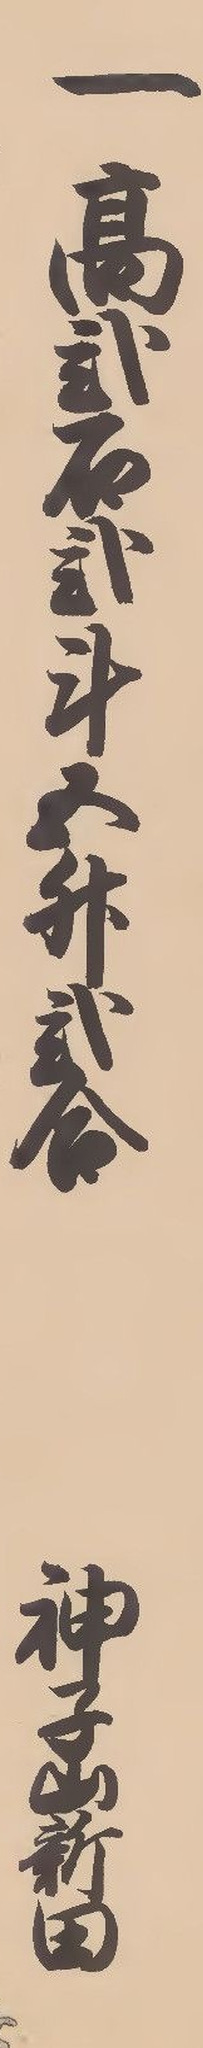一髙弐石弐斗五升弐合神小山新田
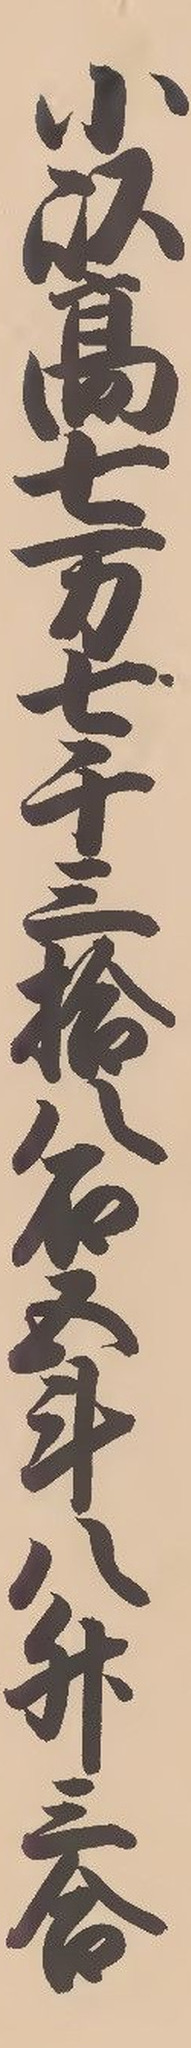小以髙七万七千三拾八石五斗八升三合
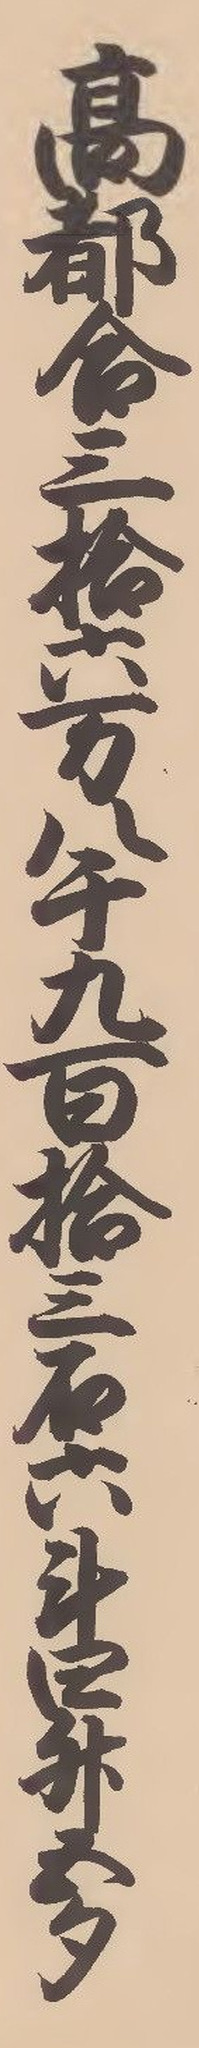髙都合三拾六万八千九百拾三石六斗四升五夕
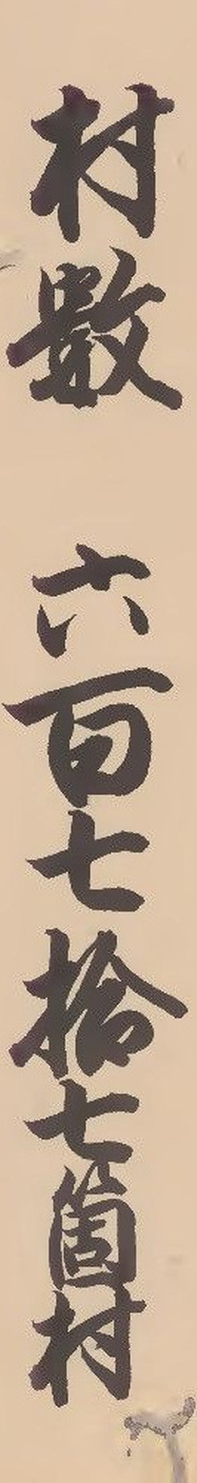村數六百七拾七箇村

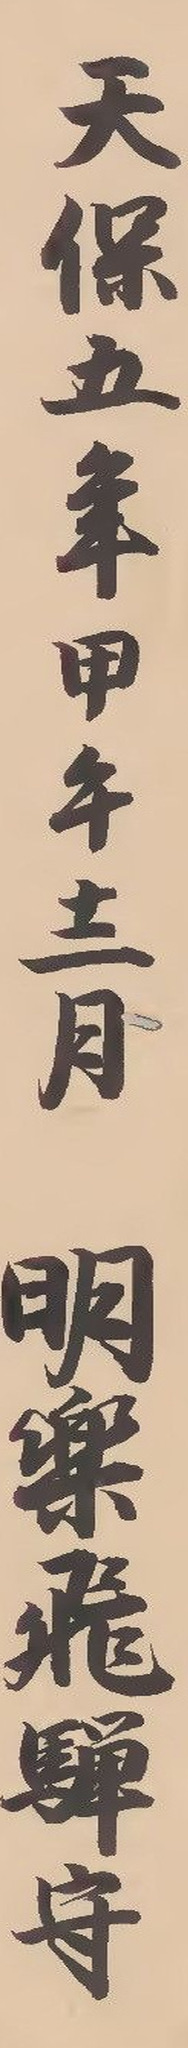天保五年甲午十二月明樂飛騨守
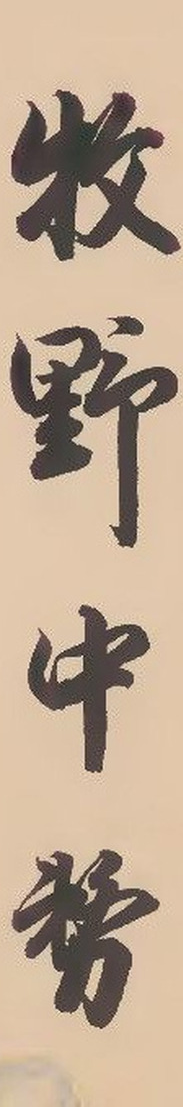牧野中務
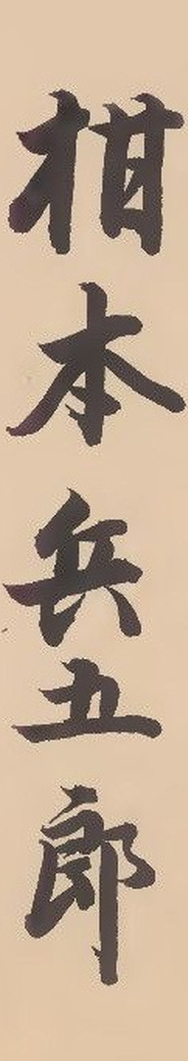柑本兵五郎
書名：豊前国郷帳
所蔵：国立公文書館 National Archives of Japan
